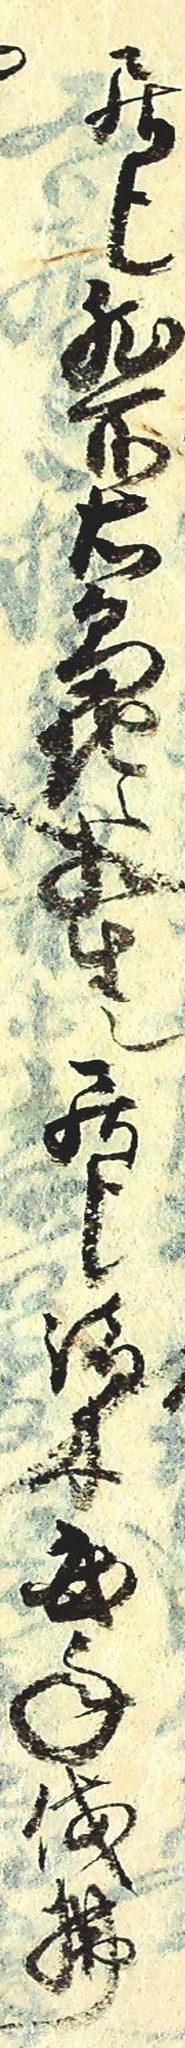居申候然所右畠地に相生し居申候諸木当年伐払
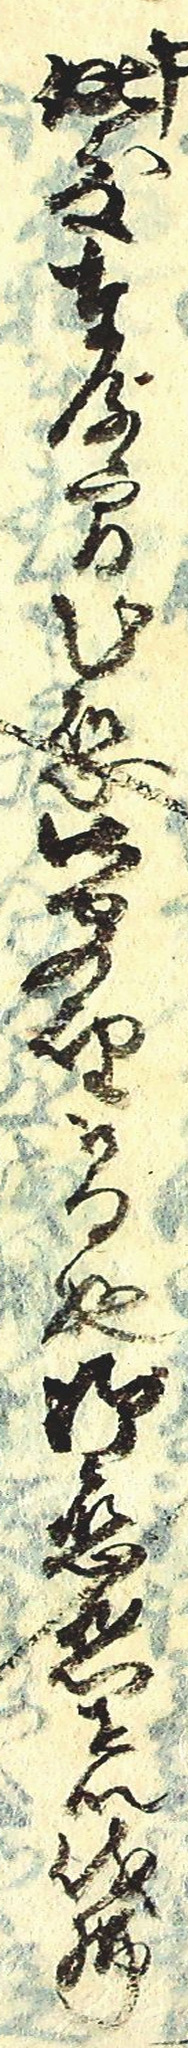申度奉存候間乍恐御聞届被為遊御慈悲を以伐払
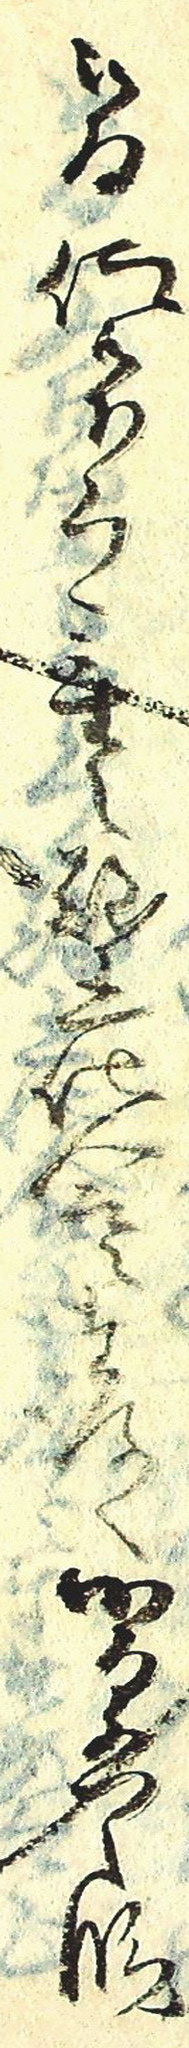被為仰被下候はゝ重々難有仕合に奉存候仍て右之段
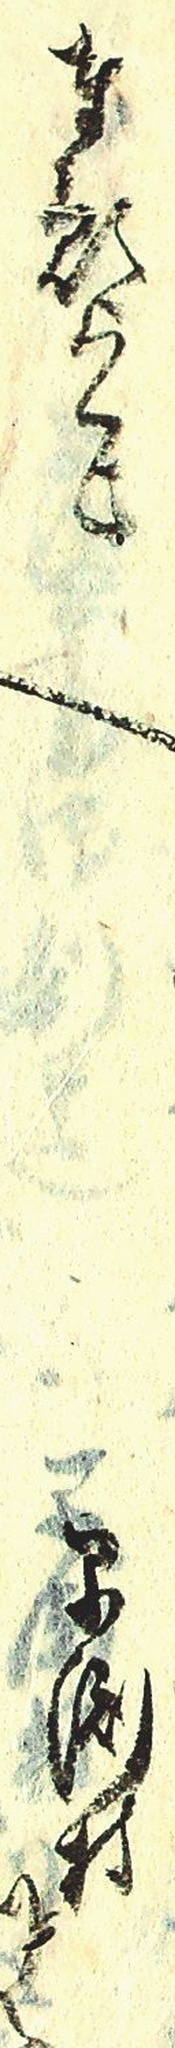奉願上候以上早渕村
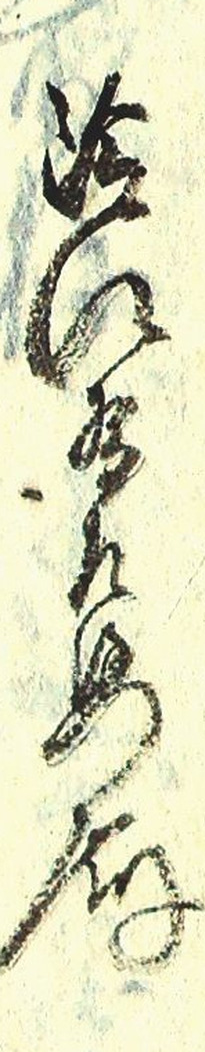鈴江為左衛門殿
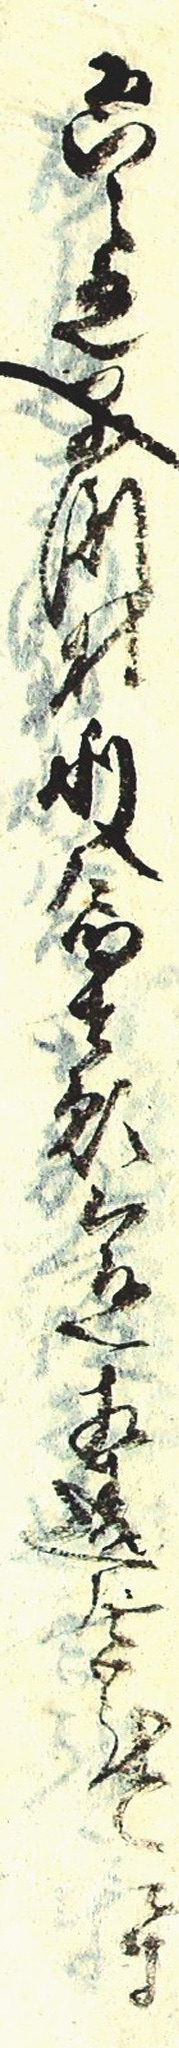右之通早淵村利八郎奉願上通相違無御座候に付
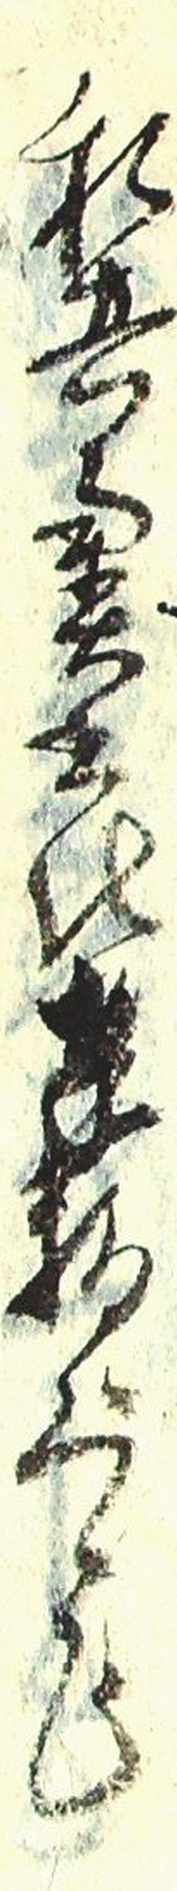私共奥書仕奉指上候以上

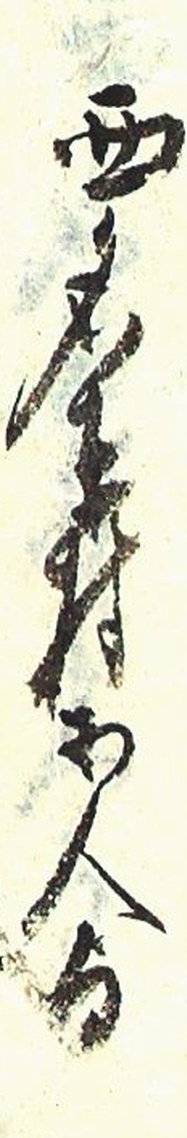西名東村五人与
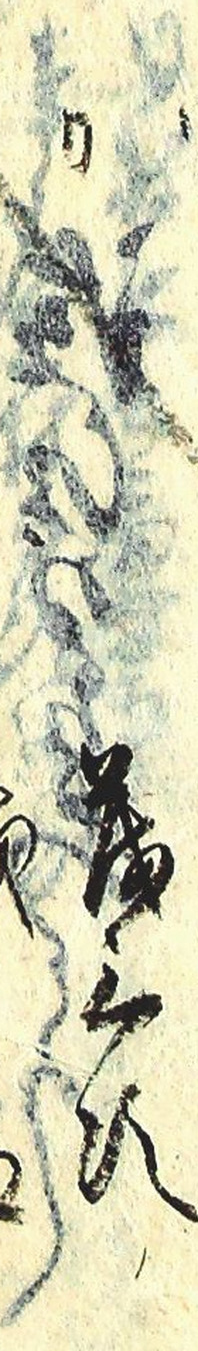同茂三次
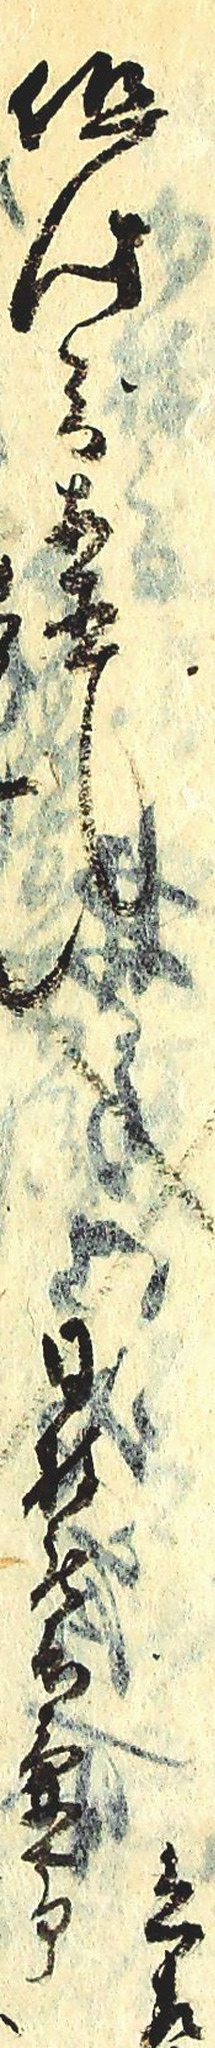但此分相直し同村庄屋兼帯
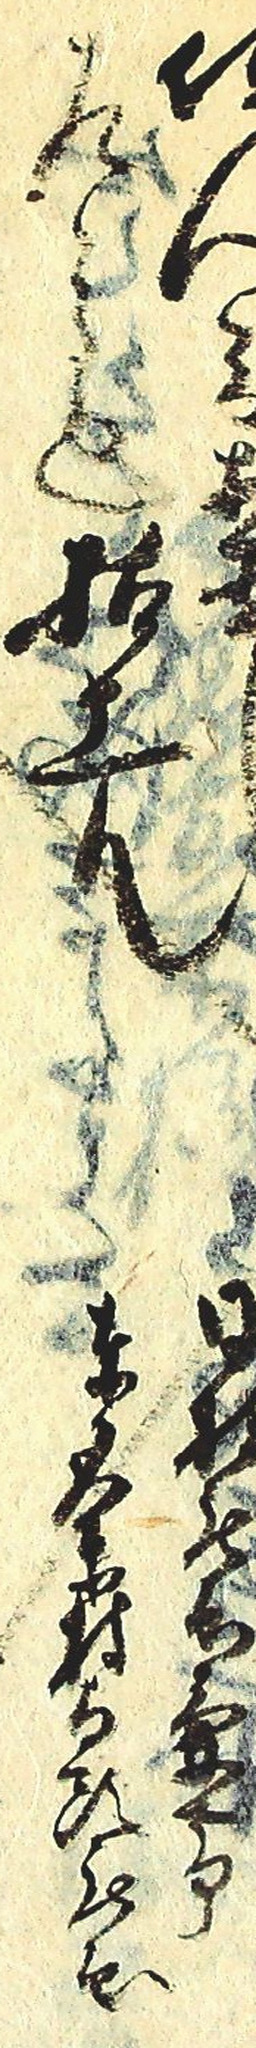左之通指上る東名東村与頭庄屋
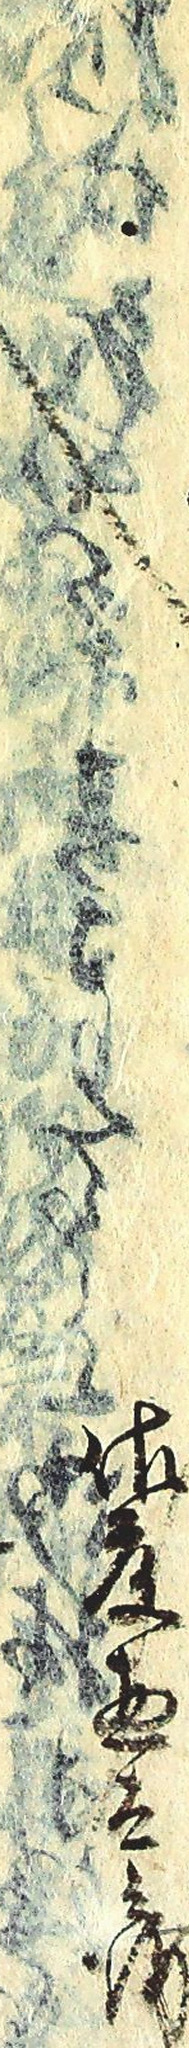佐藤惣太兵衛
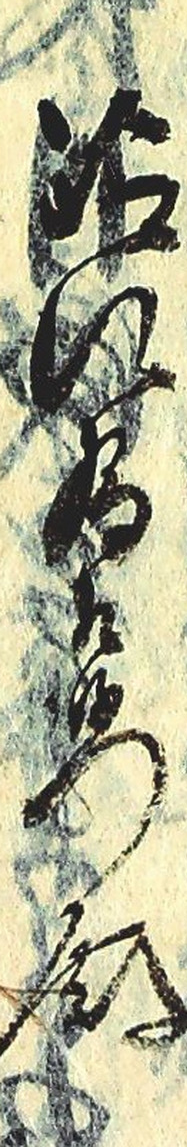鈴江為左衛門殿
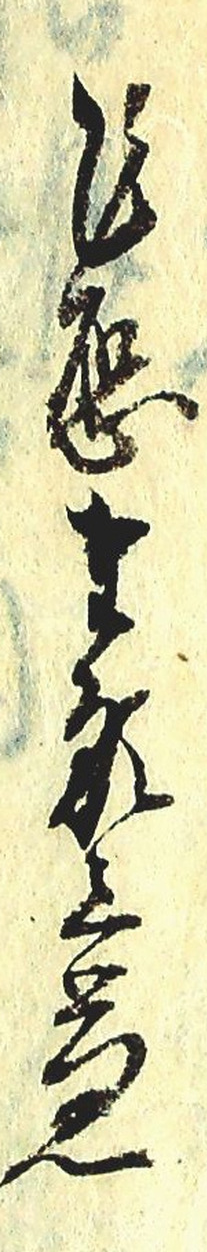乍恐奉願上覚
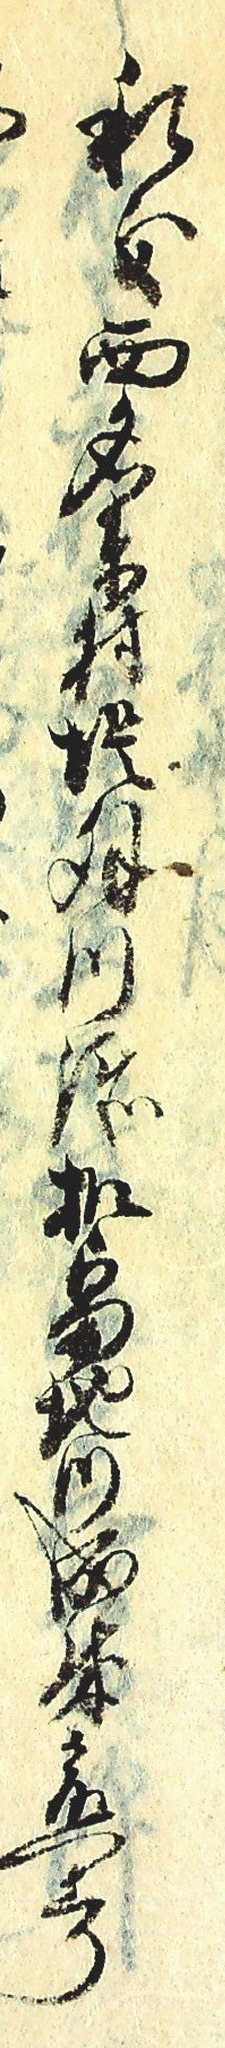私義西名東村堤外川添扣畠地川成床懸しり
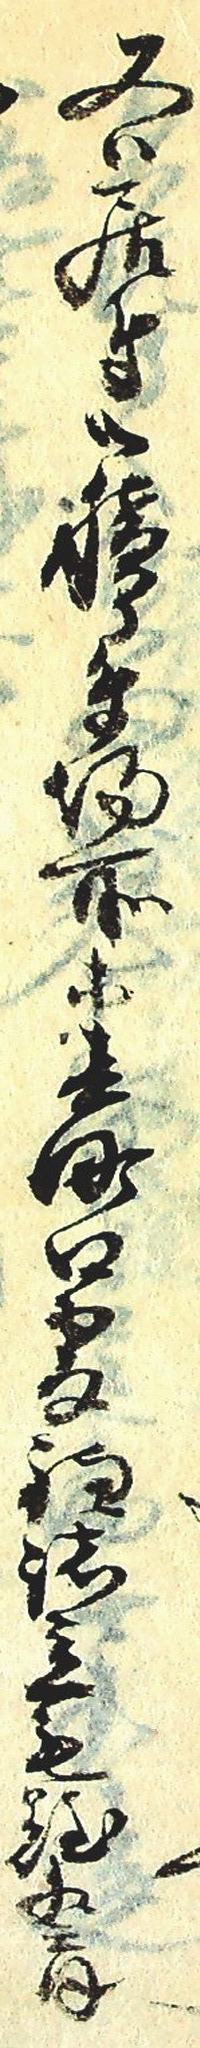又は居付御積り付場所等壱町四五反程諸立毛難相育
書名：諸御願書控(弐番）
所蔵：鳴門教育大学 Naruto University of Education
